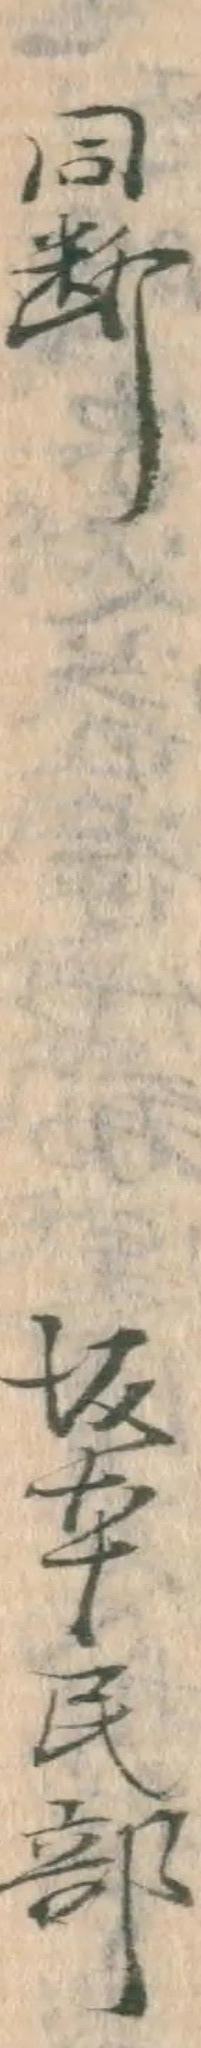同断坂本民部
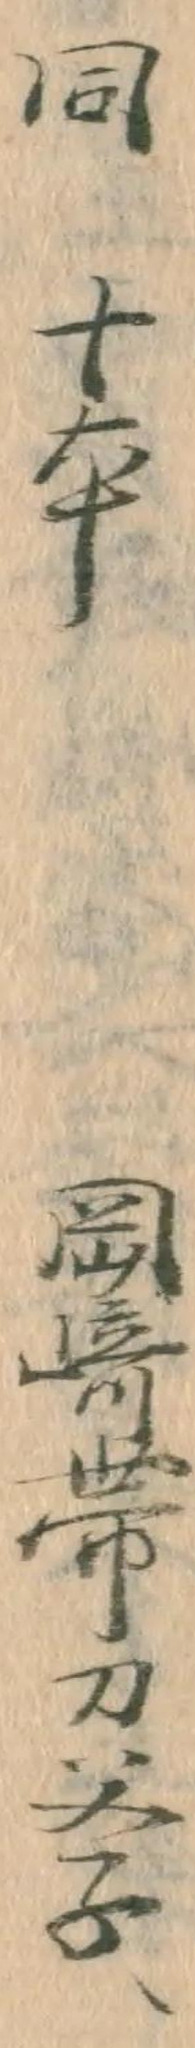同十本岡崎帯刀父子
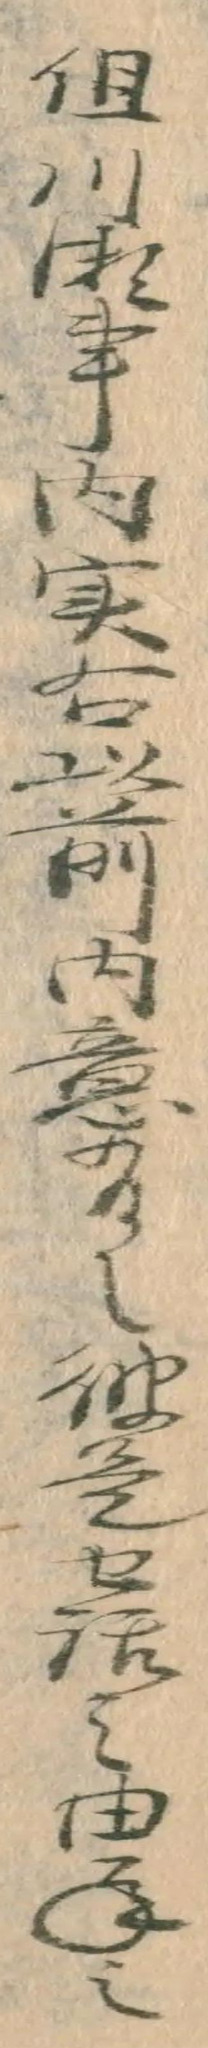但川瀬事内実右以前内意有之彼是世話之由承之
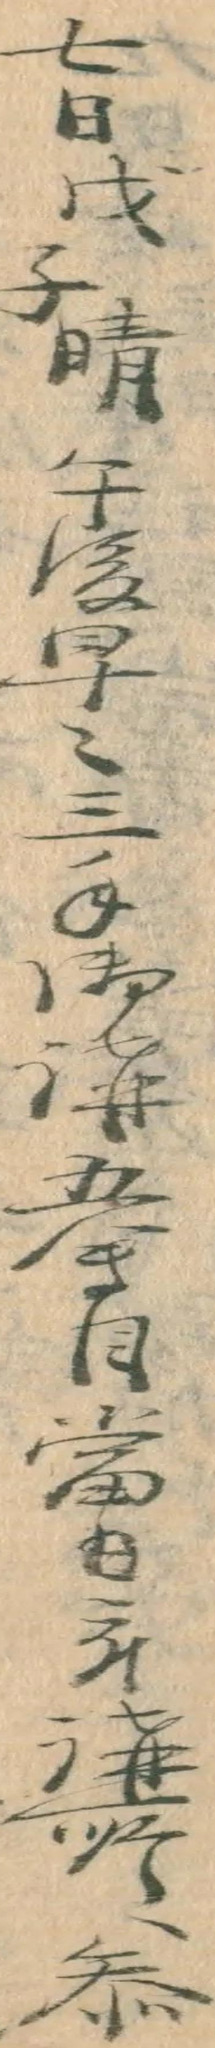七日戊子晴午後早〻三手御講五會目當日ニ付講所へ参
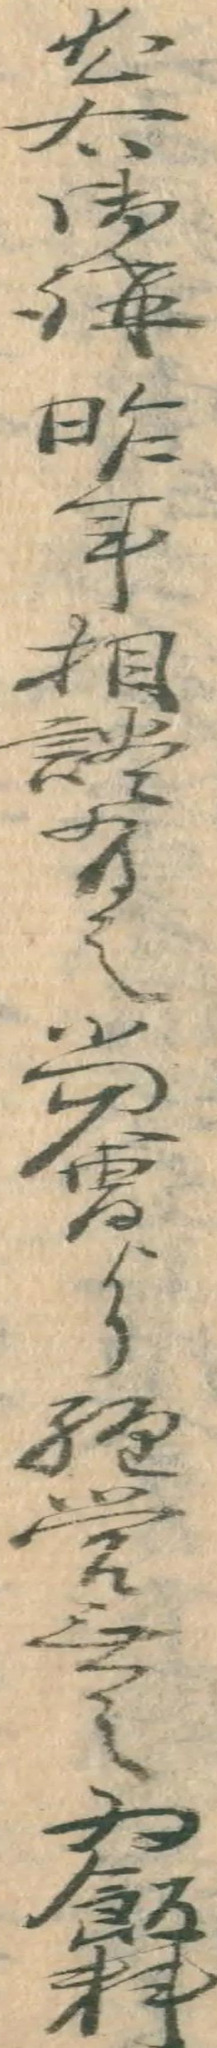尤右御講昨年相談有之當會より経営無之為飯料
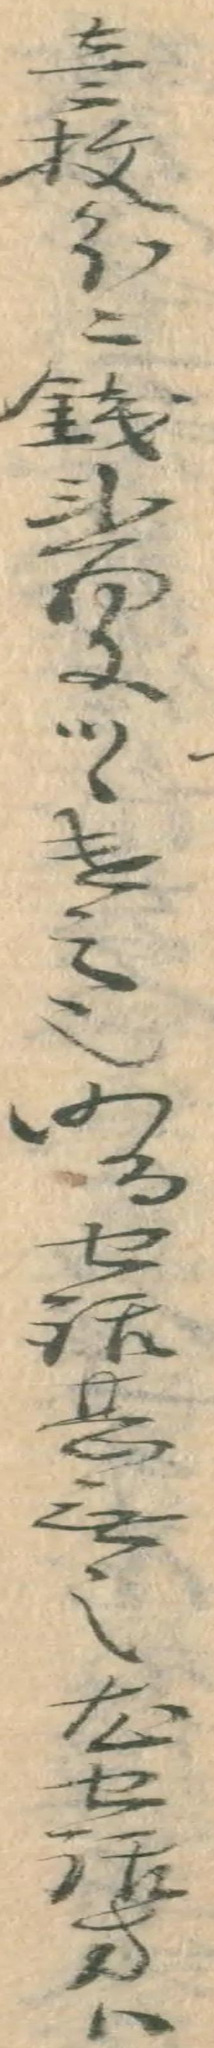壱枚分ニ銭弐百文ツヽ遣之也仍而世話甚無之尤世話方ハ

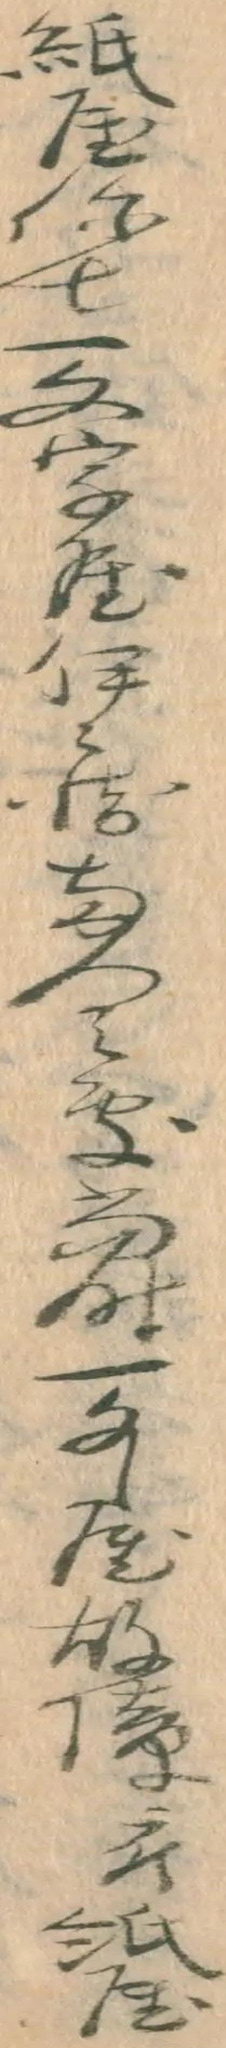紙屋弥七一文字屋伊兵衛両人之處當時一文之屋余故障に付紙屋
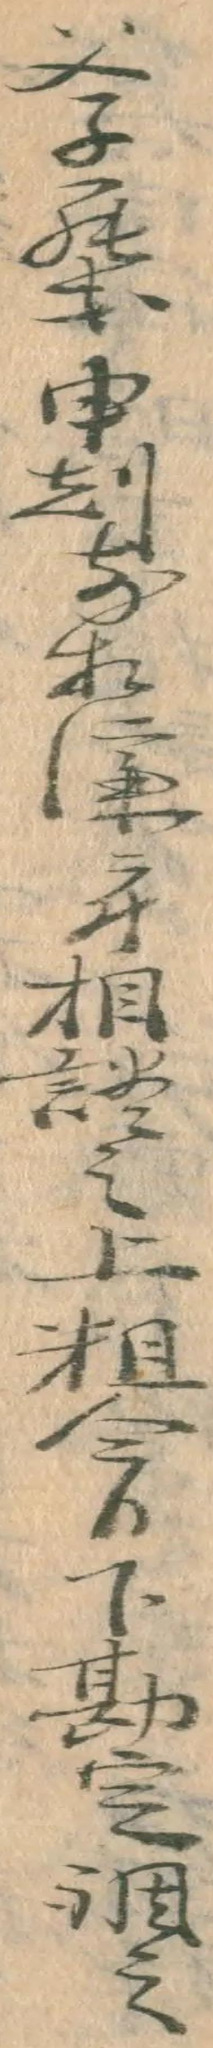父子罷本申刻前相添ニ付相談之上粗今日下勘定調之
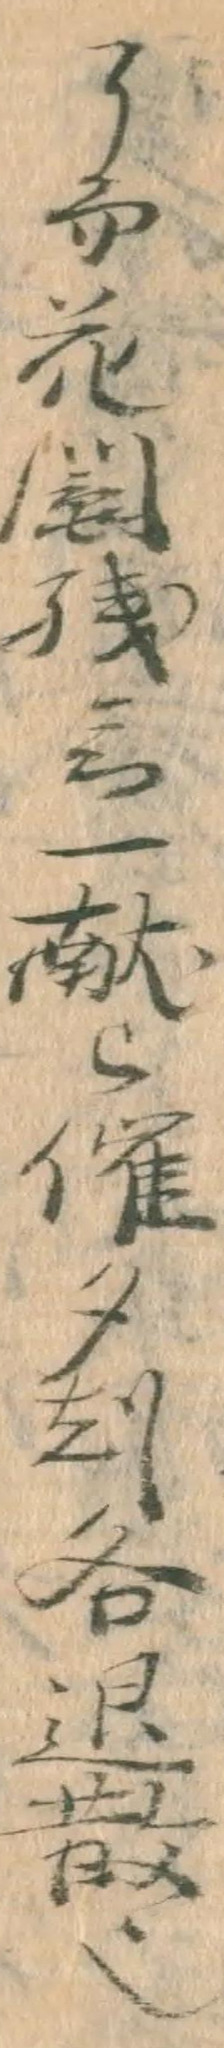了而花鬮残ニ而一献被催夕刻各退散也
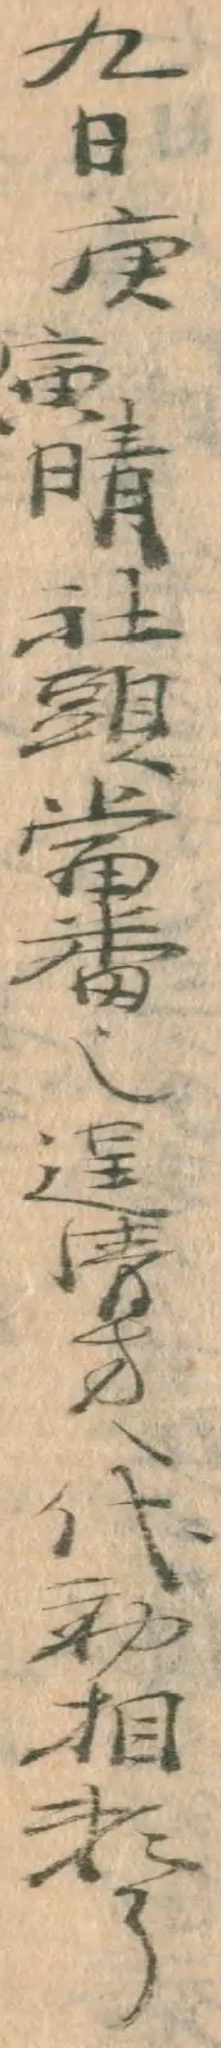九日庚寅晴社頭當番也逞清方代動相頼了
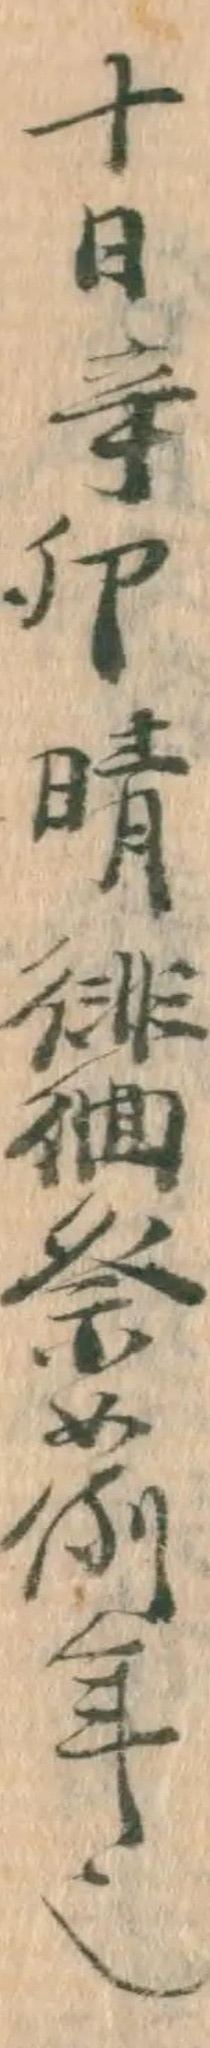十日辛卯晴緋徊祭如例年也
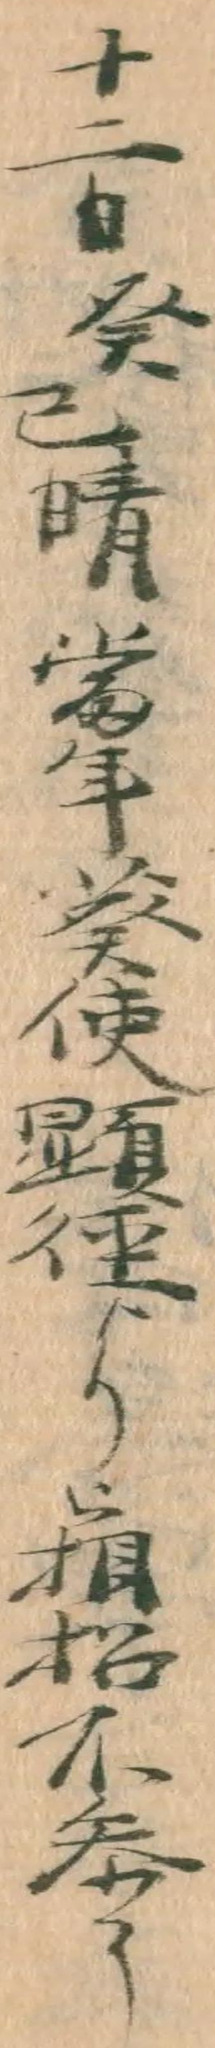十二日癸巳當年葵使顕径より被相招不参了
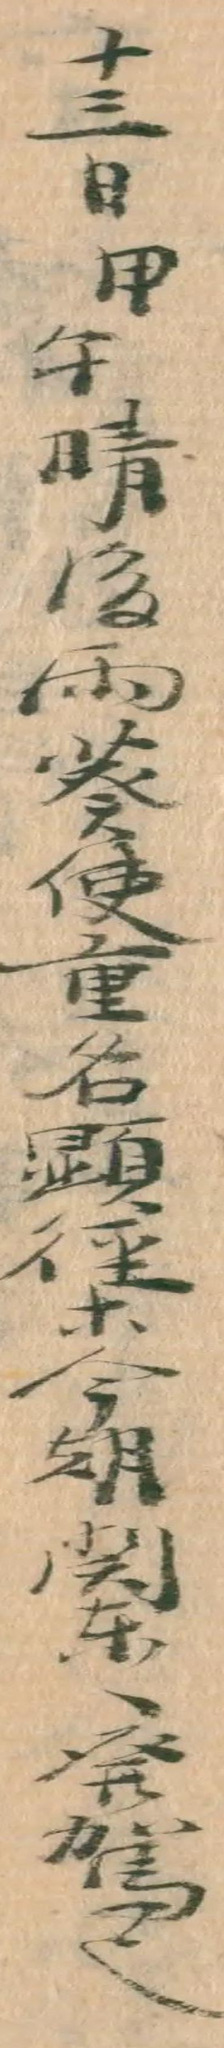十三日甲午晴後雨葵使重名顕径等今朝関東へ発駕也
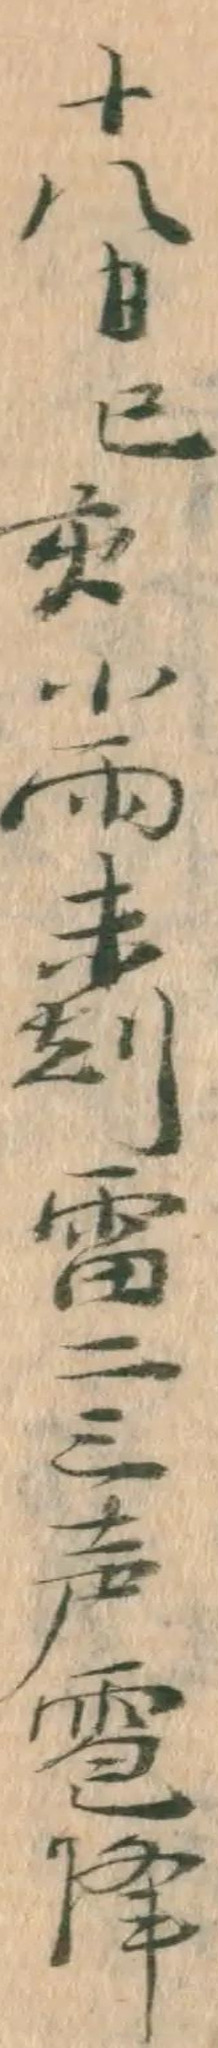十八日己亥小雨未刻雷二三声雹降
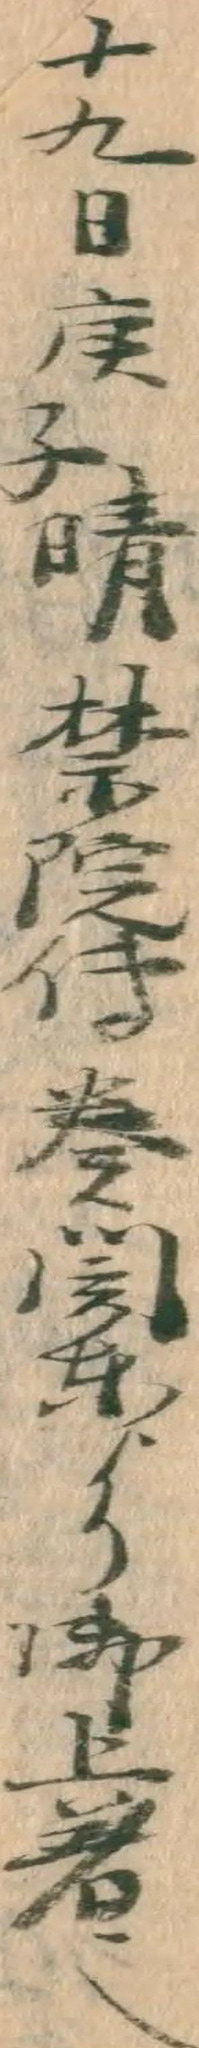十九日庚子晴禁院伝奏関東より御上着也
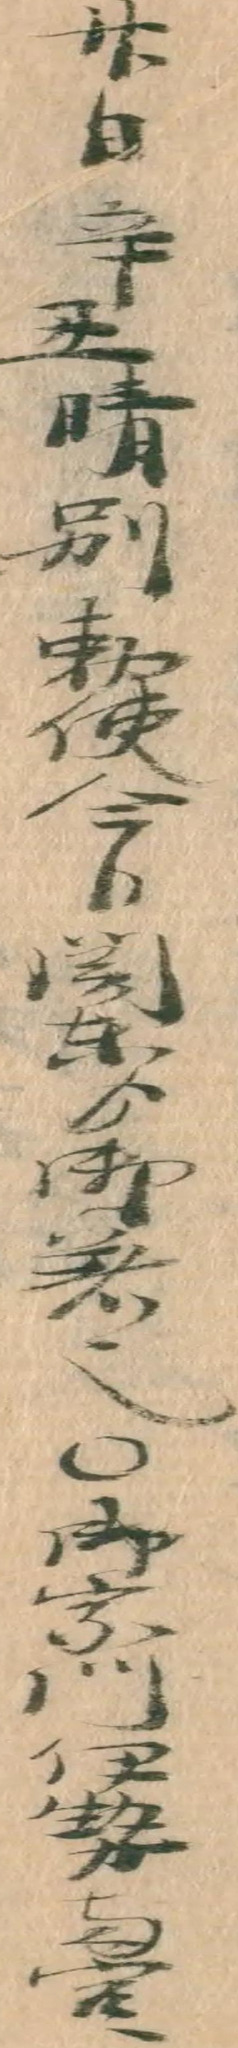廿日辛丑晴別勅使今日関東ゟ御着也○御家門伊勢両宮ヘ
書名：賀茂社記録. 第65冊
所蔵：国立国会図書館 National Diet Library, JAPAN
